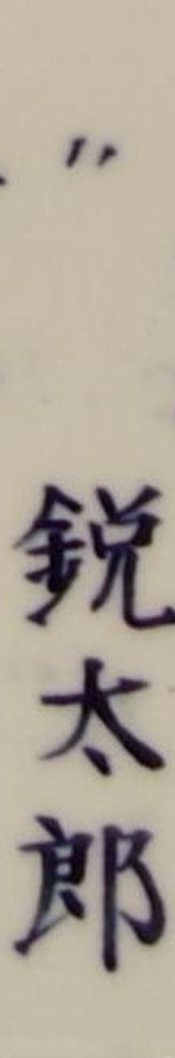鋭太郎
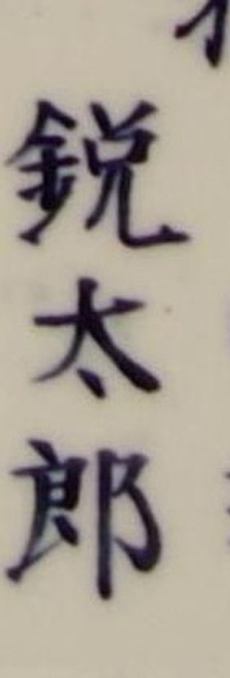鋭太郎
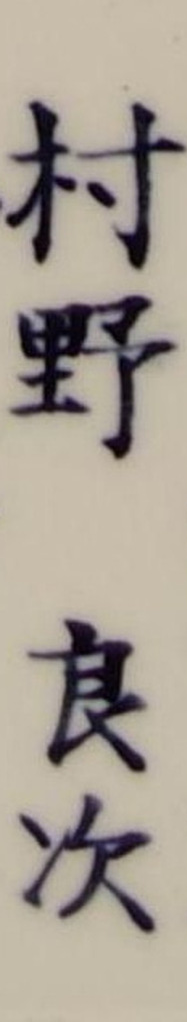村野良次
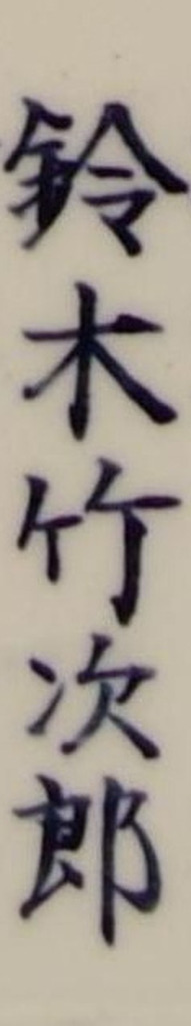鈴木竹次郎
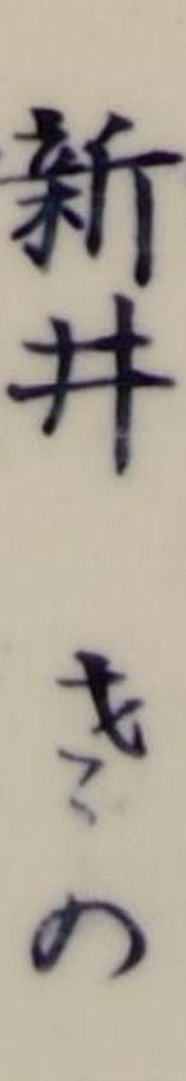新井きの
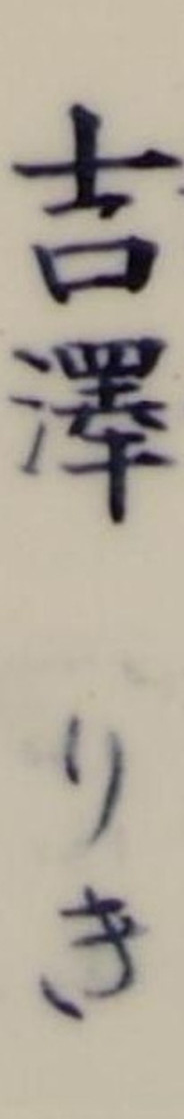吉澤りき
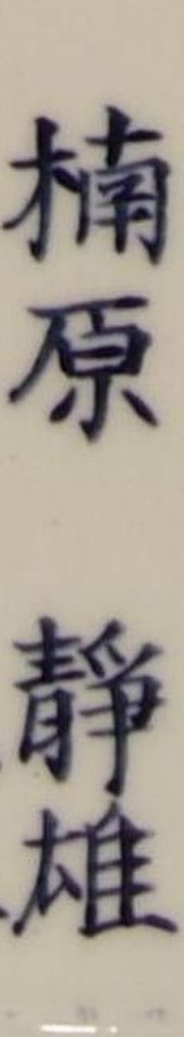楠原静雄
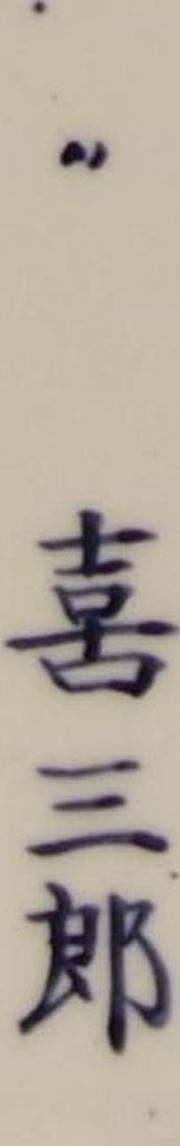喜三郎
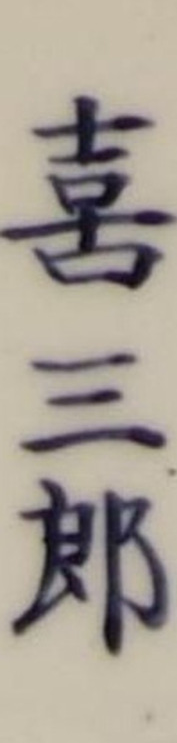喜三郎
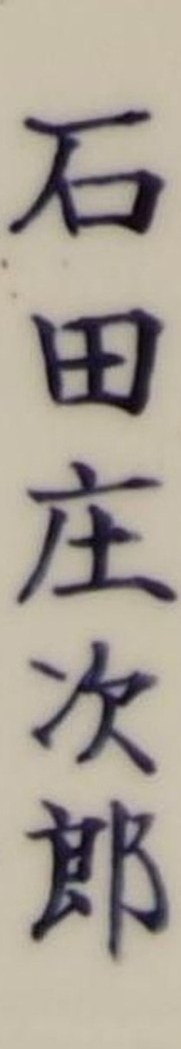石田庄次郎
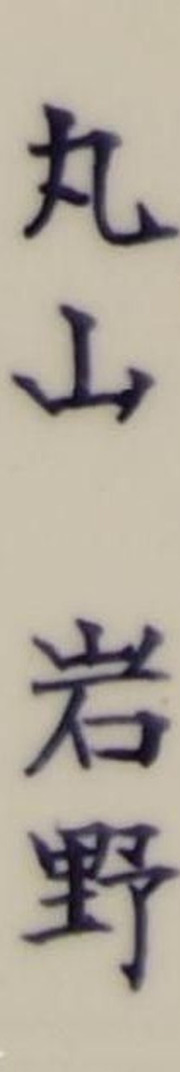丸山岩野
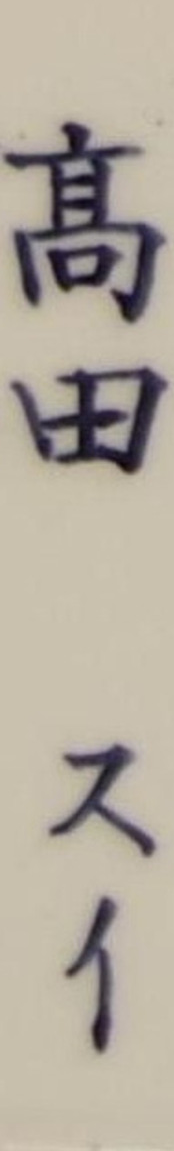高田スイ
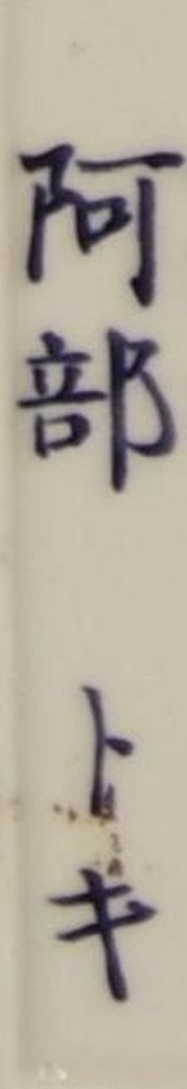阿部トキ

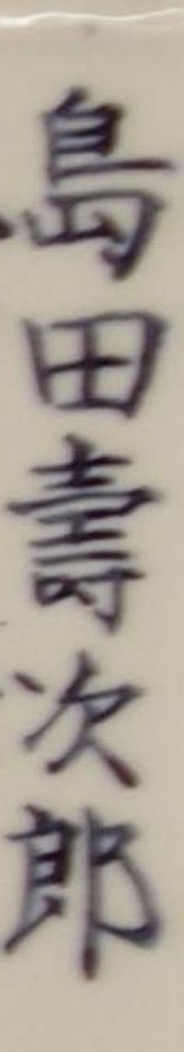島田壽次郎
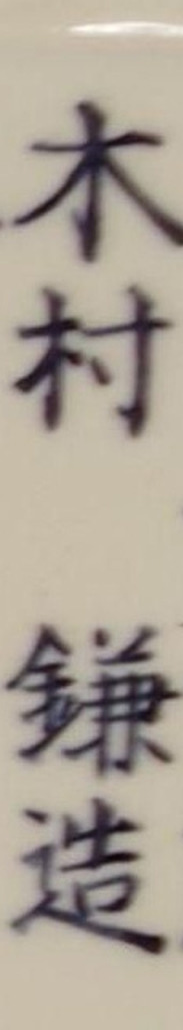木村鎌造
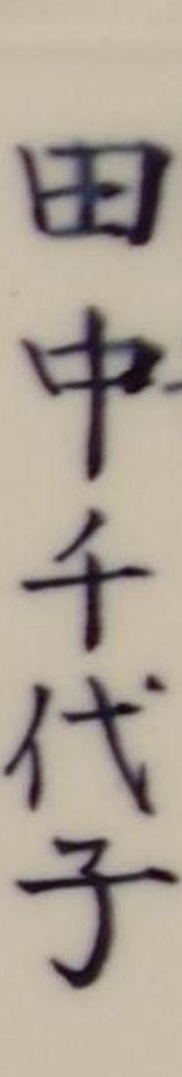田中千代子
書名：E~L
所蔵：高野山金剛峯寺
